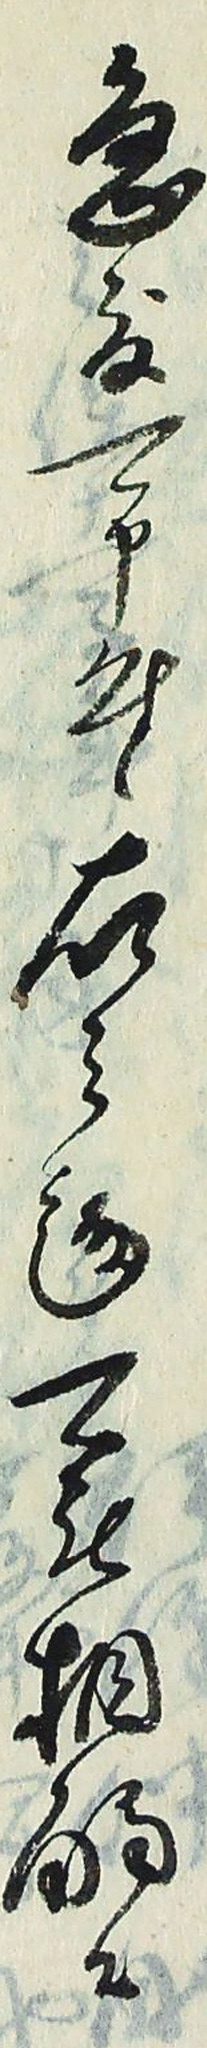急度可申付右之趣可被相触候
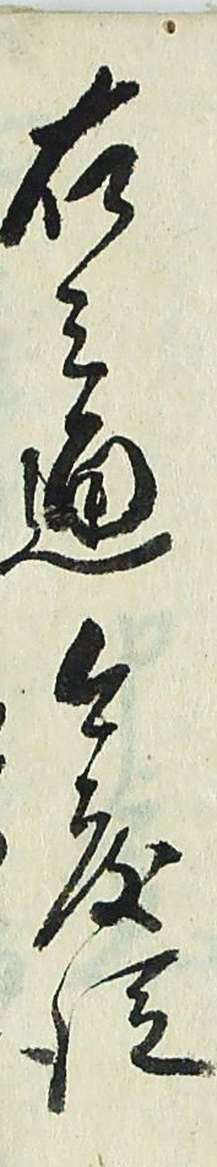右之通今度従
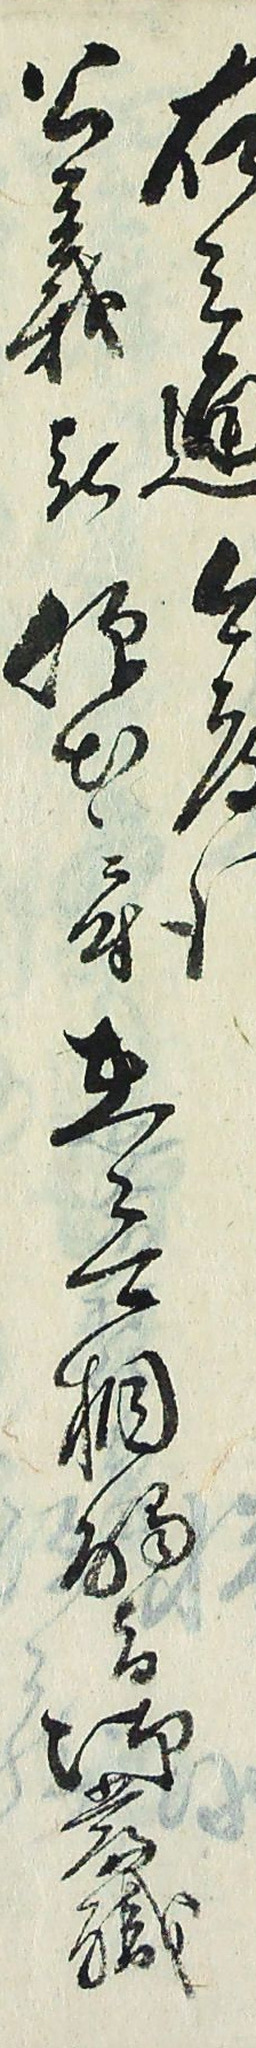公義被仰出候に付在々可相触旨御当職
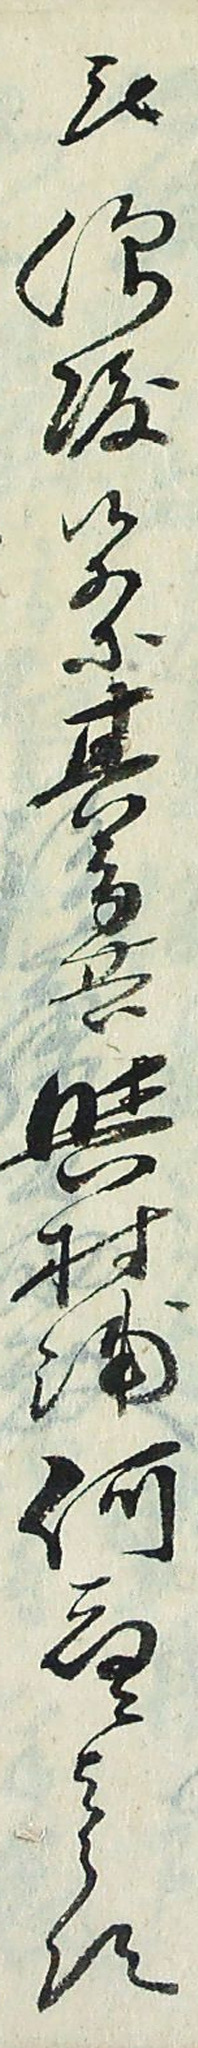被仰渡候条其方共与村浦何者によらす
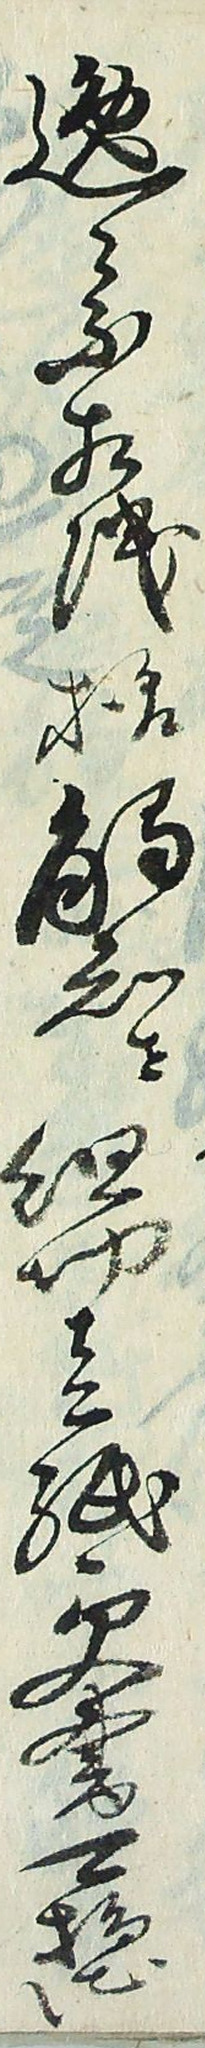逸々不相洩様触知せ組切壱紙受書可指出候
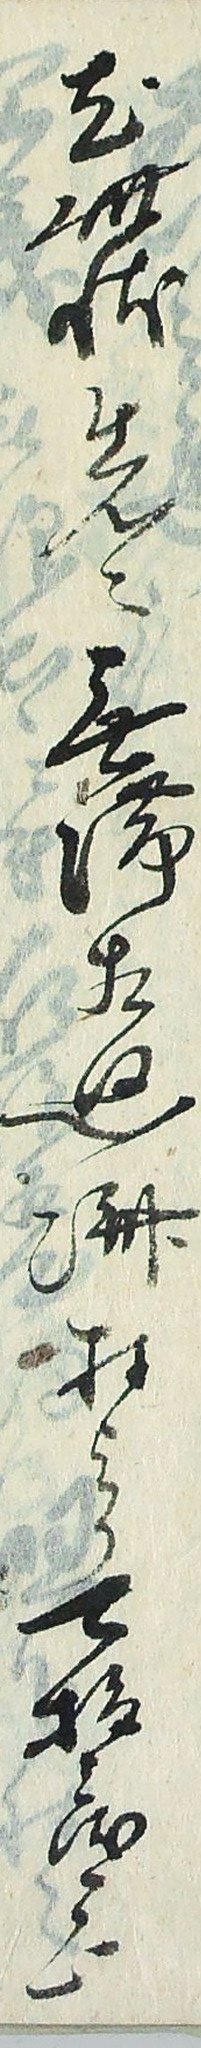尤此状先々無滞相廻済村ゟ可指戻候以上
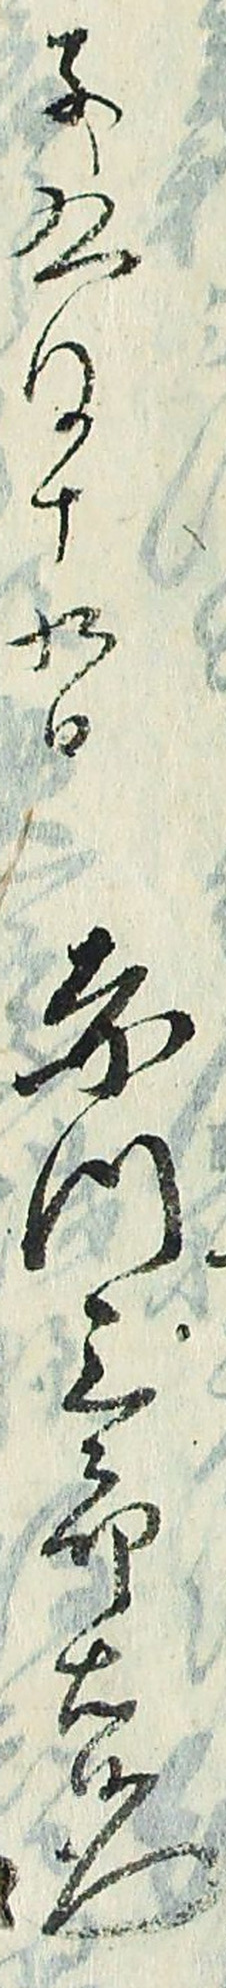子九月十九日赤川三郎右衛門
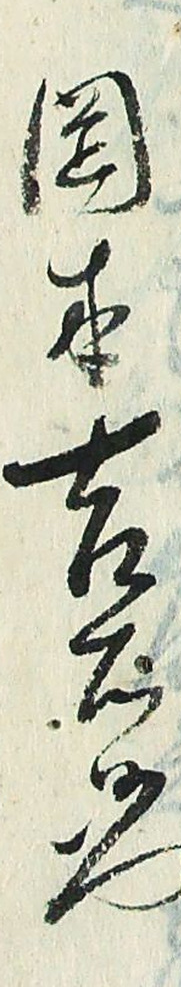岡本吉右衛門

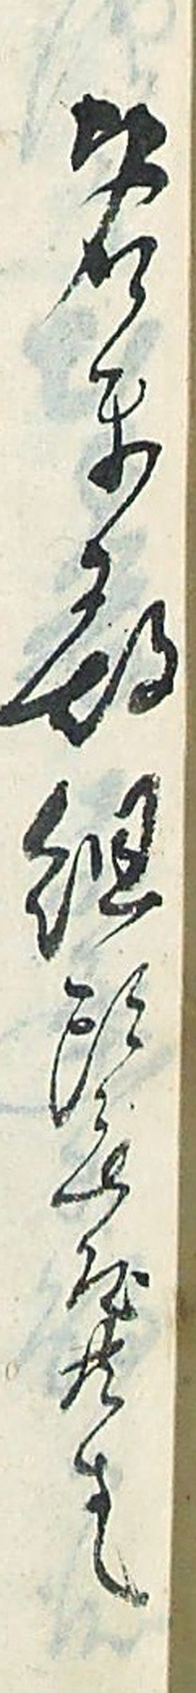名東郡組頭庄屋共方へ
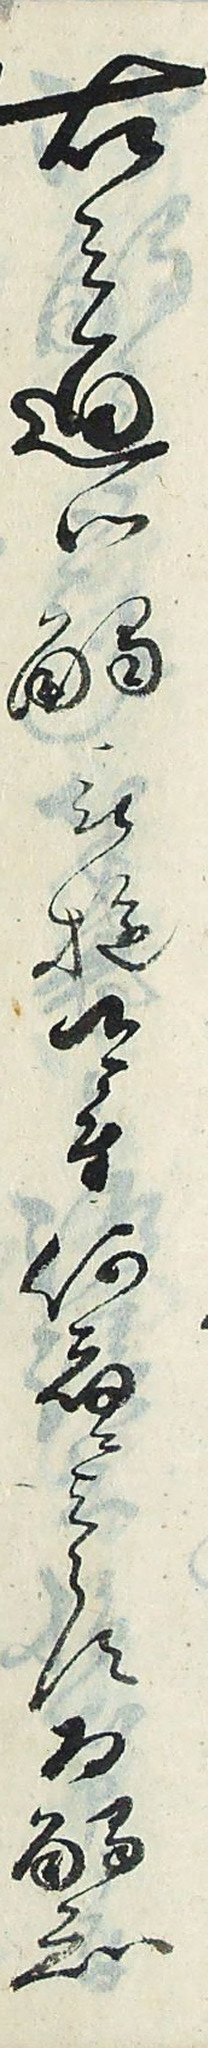右之通御触被遊候に付何者によらす為触知
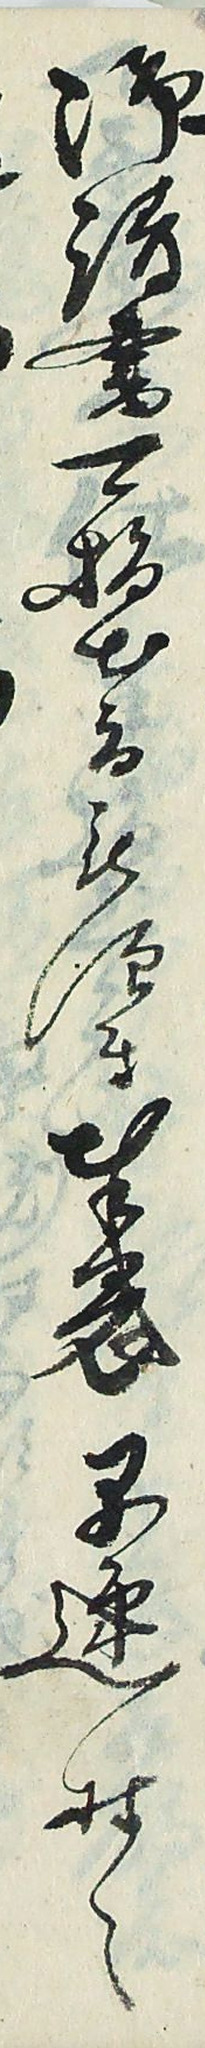御請書可指出旨被仰付奉畏早速村々
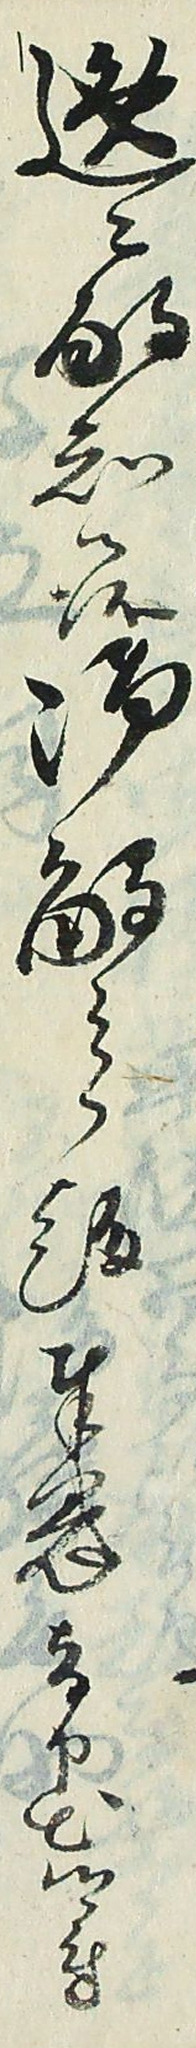逸々触知候所御触之御趣奉畏旨申出候に付
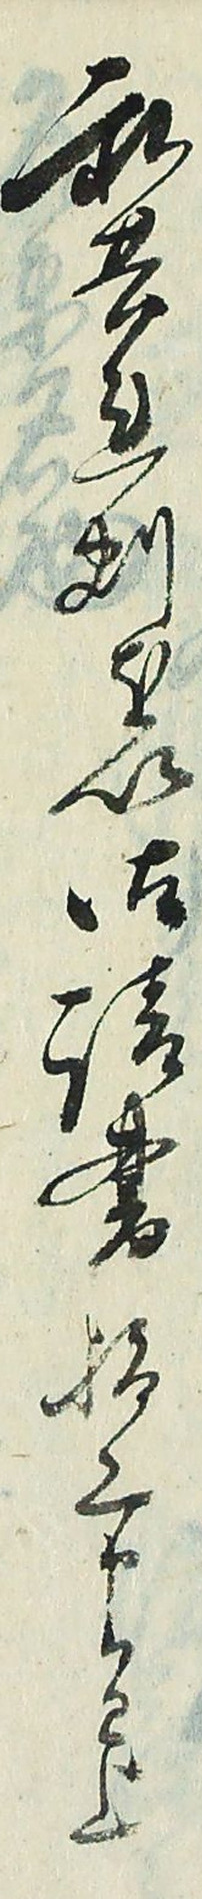私共連判を以御請書指上申候以上
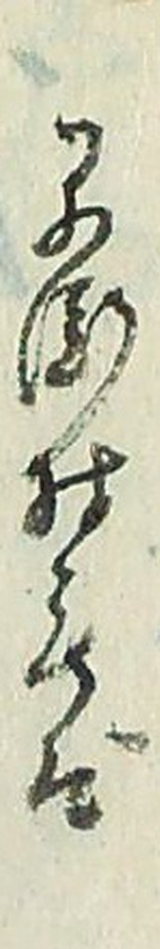早淵村庄屋
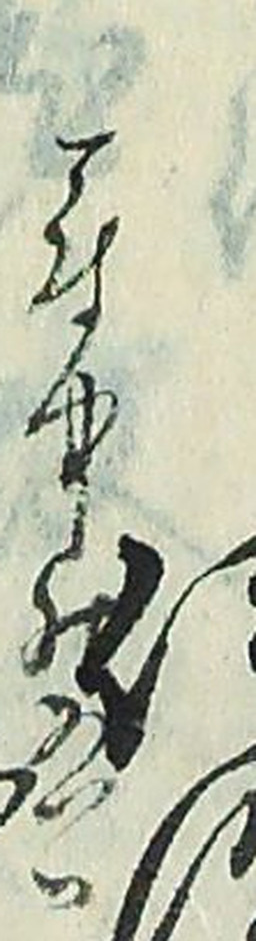早淵村庄屋
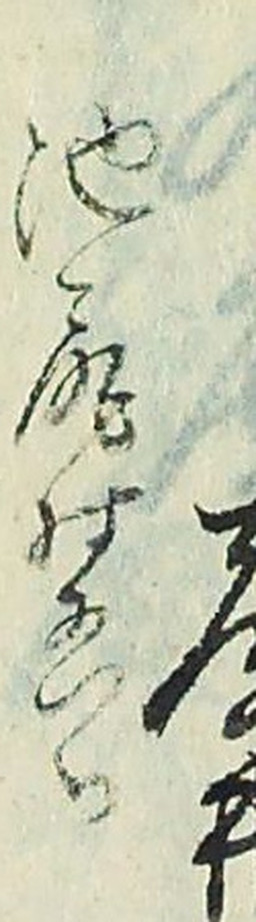池尻村右同
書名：諸御用御□受書控
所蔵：鳴門教育大学 Naruto University of Education
